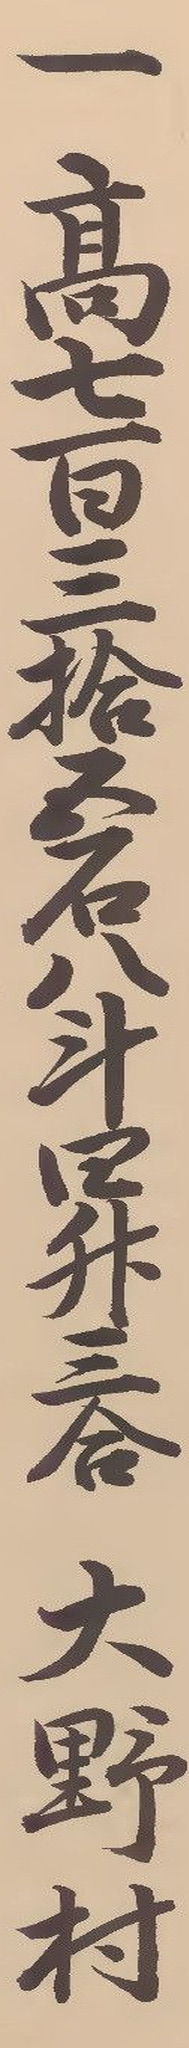一高七百三拾五石八斗四升三合大野村
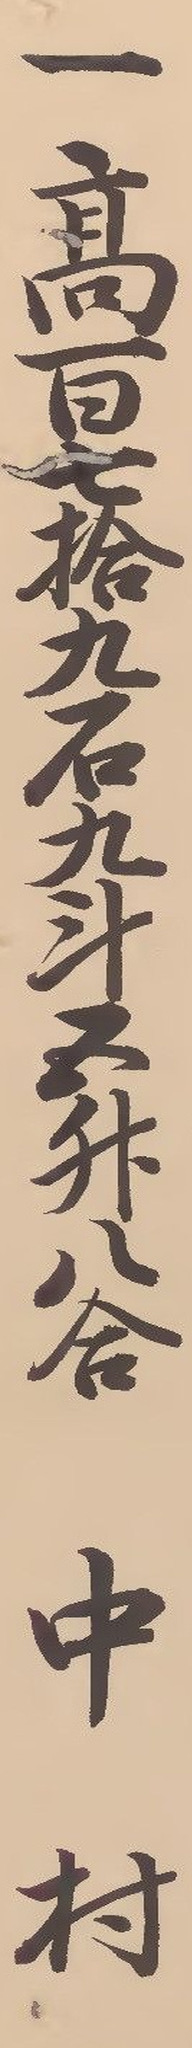一高百七拾九石九斗五升八合中村

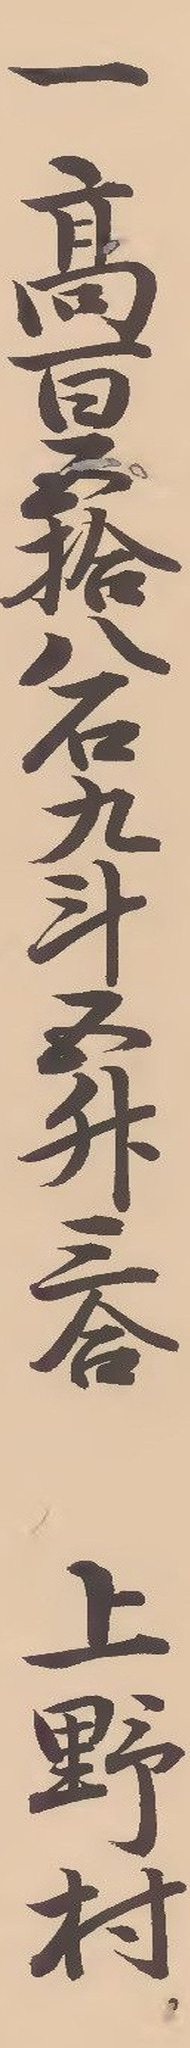一高百五拾八石九斗五升三合上野村
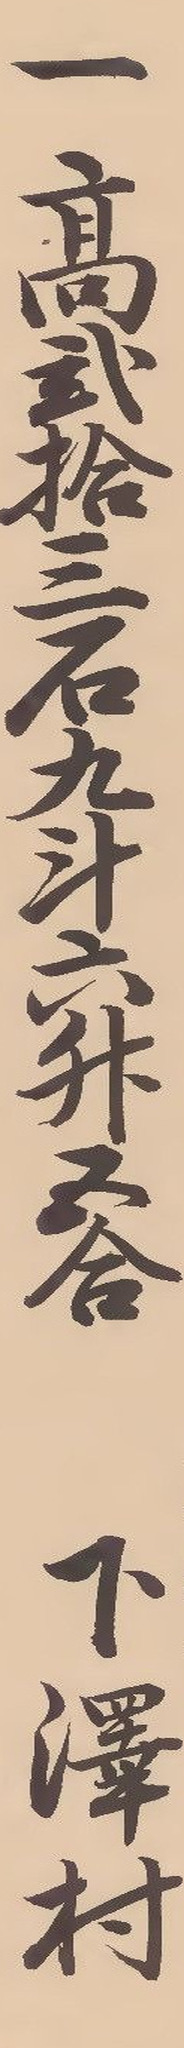一高弐拾三石九斗六升五合下沢村
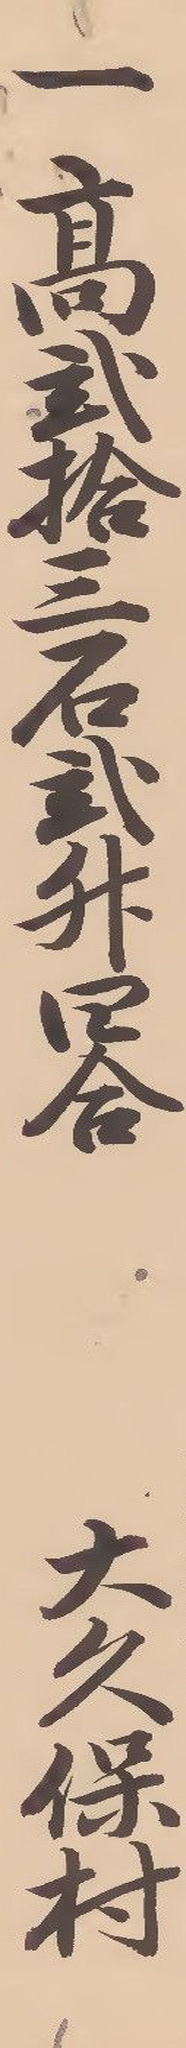一高弐拾三石弐升四合大久保村
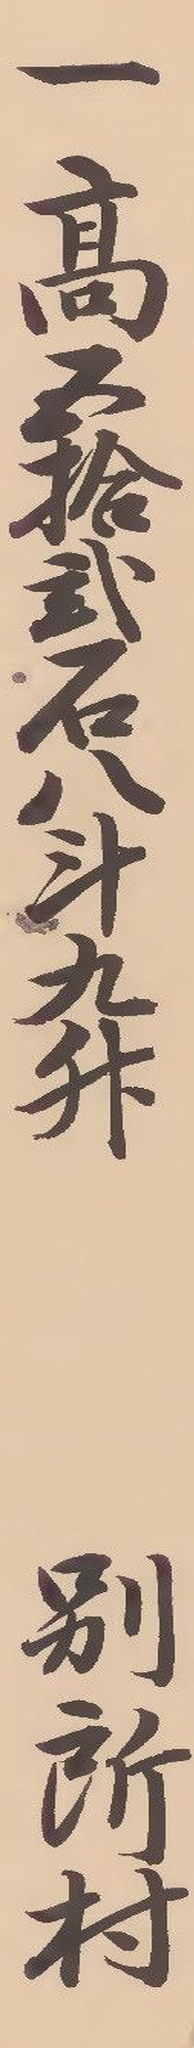一高五拾弐石八斗九升別所村
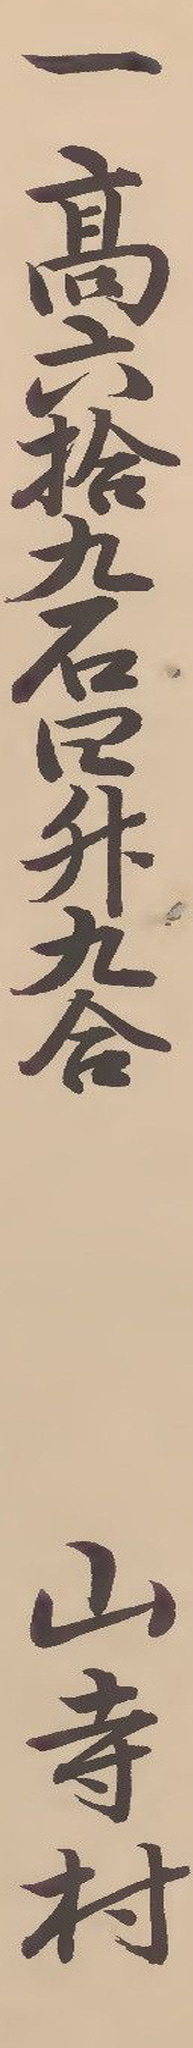一高六拾九石四升九合山寺村
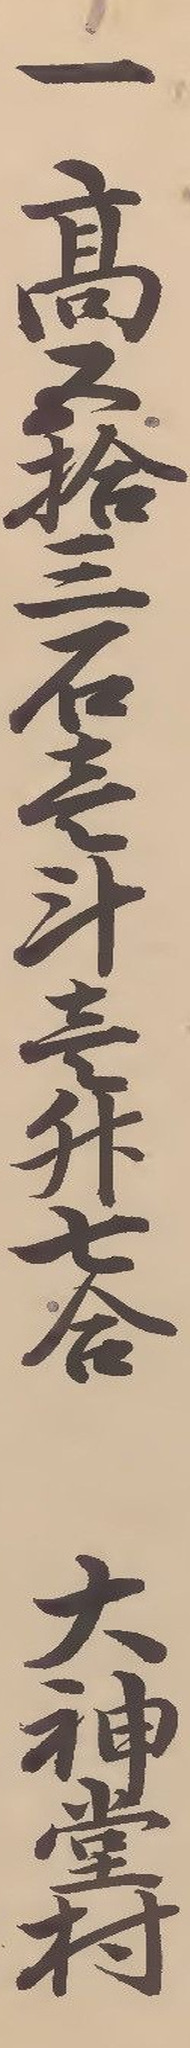一高五拾三石壱斗壱升七合大神堂村
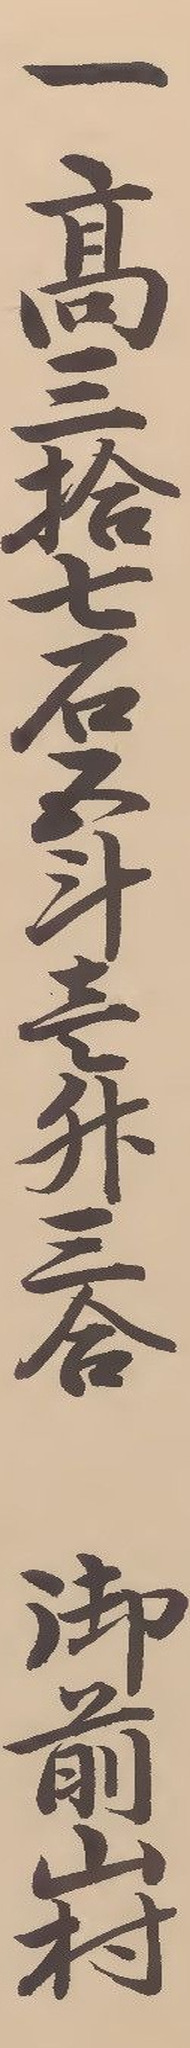一高三拾七石五斗壱升三合御前山村
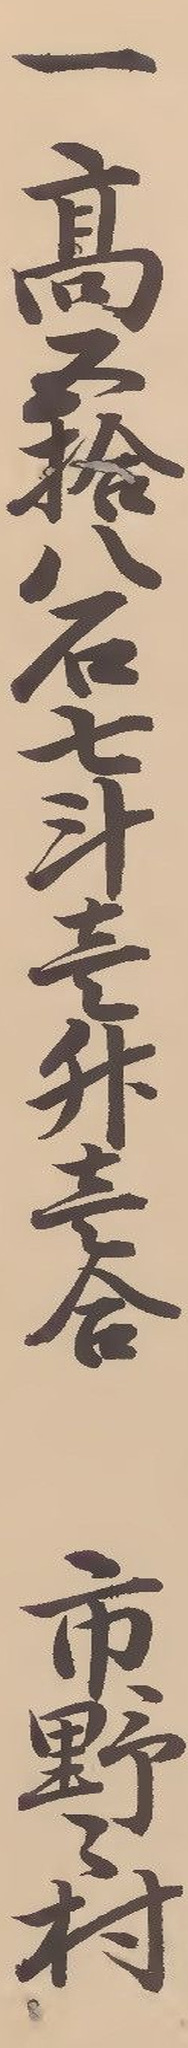一高五拾八石七斗壱升壱合市野々村

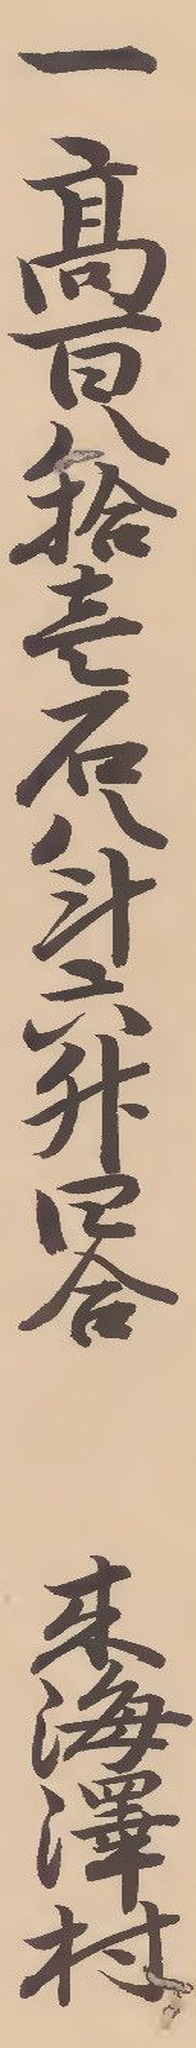一高百八拾壱石八斗六升四合来海沢村
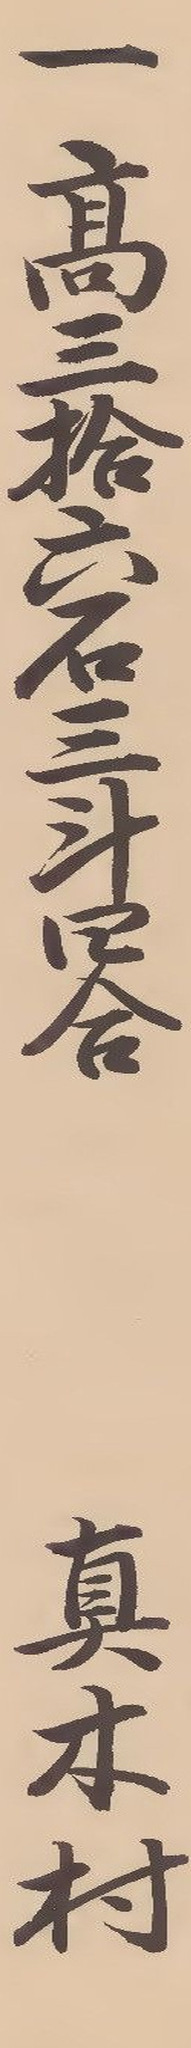一高三拾六石三斗四合真木村
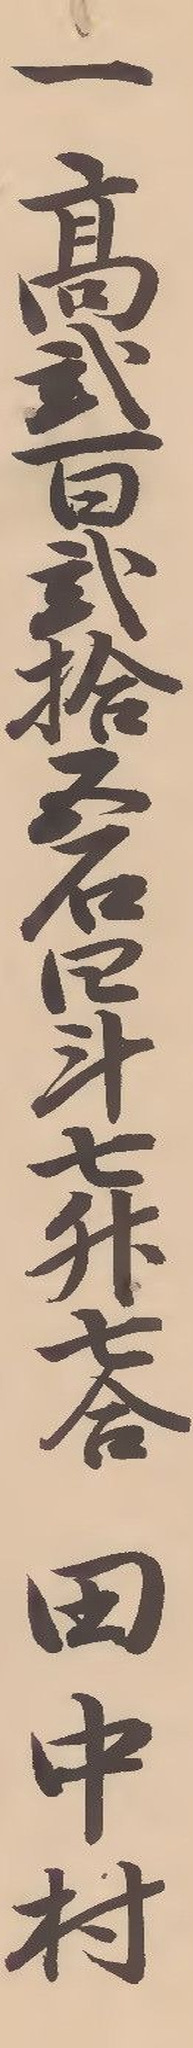一高弐百弐拾五石四斗七升七合田中村
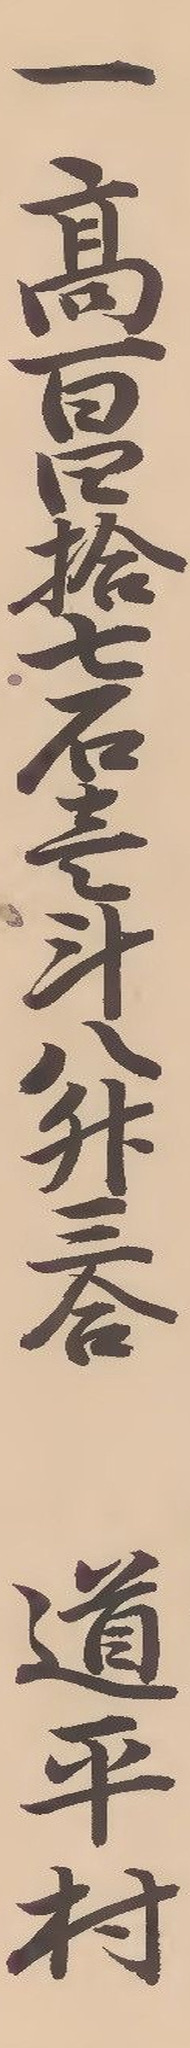一高百四拾七石壱斗八升三合道平村
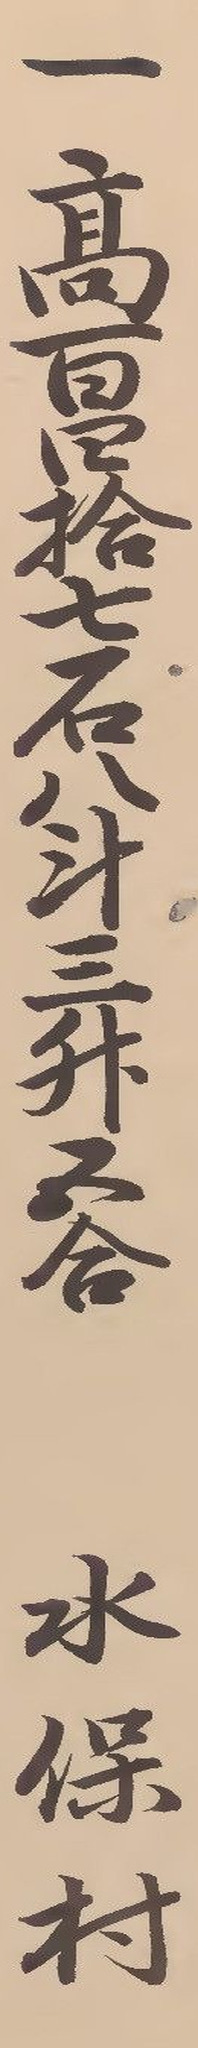一高百四拾七石八斗三升五合水保村
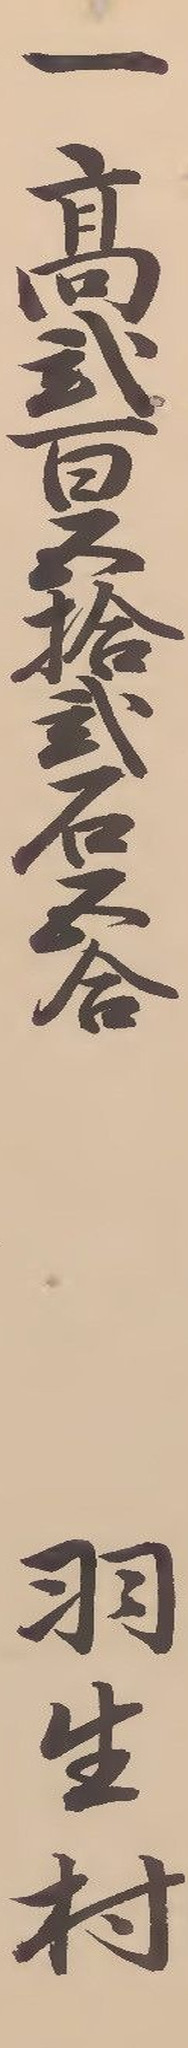一高弐百五拾弐石五合羽生村
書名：越後国郷帳　上
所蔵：国立公文書館 National Archives of Japan
